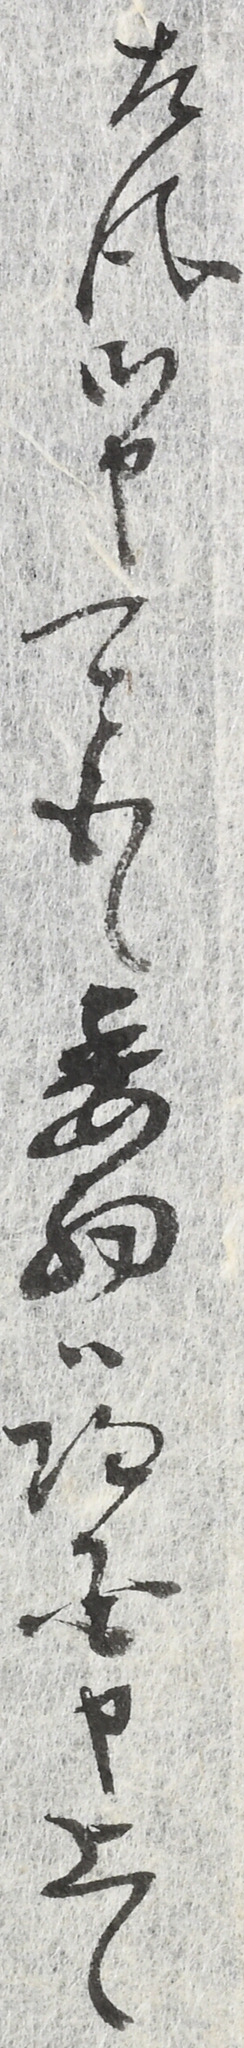左様御申可被成候委細ハ帰国申上候
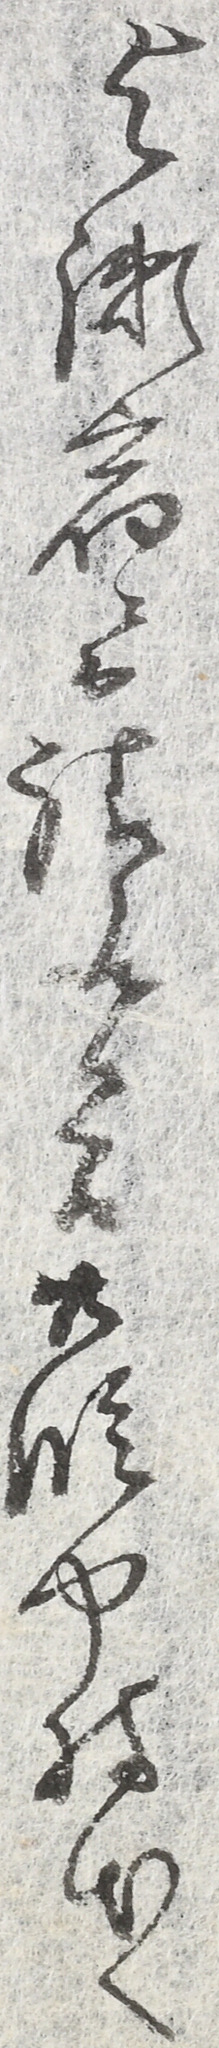与瀬宿ニ而請取候間此段中村氏へ
